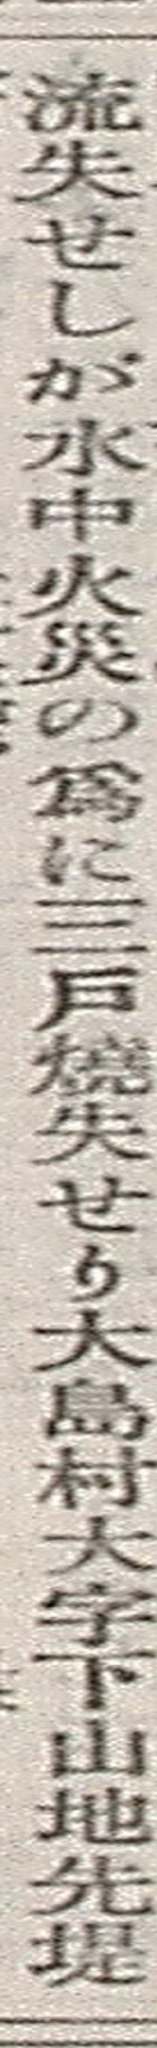流失せしが水中火災の為に三戸焼失せり大島村大字下山地先堤
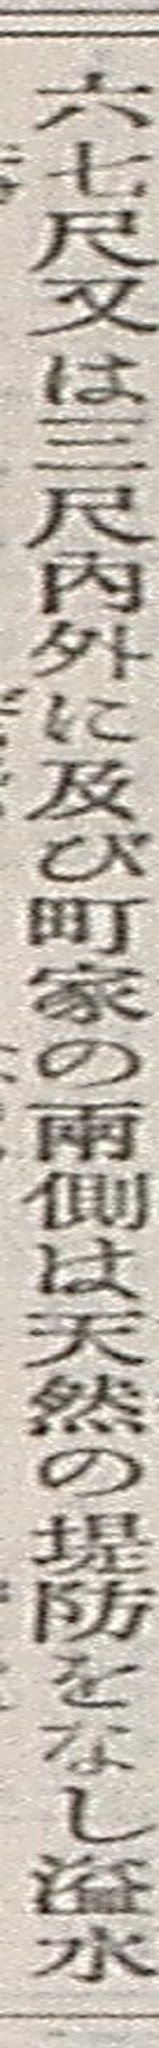六七尺又は三尺内外に及び町家の両側は天然の堤防をなし溢水
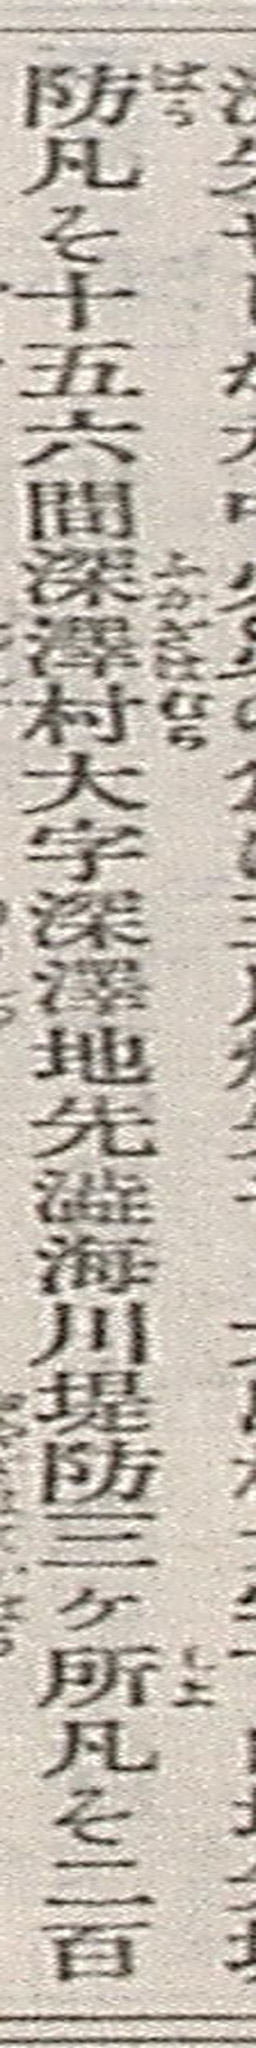防凡そ十五六間深沢村大字深沢地先渋海川堤防三ヶ所凡そ二百
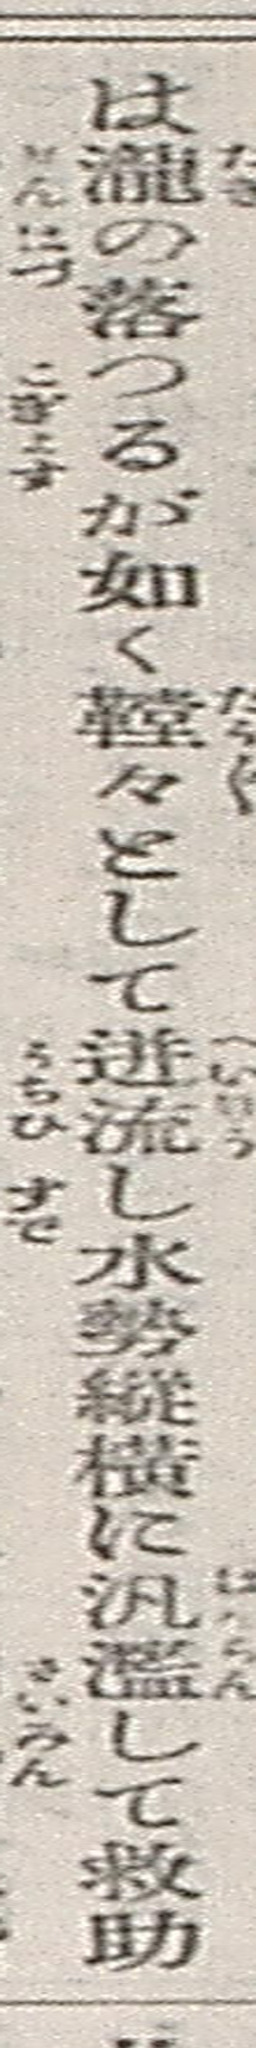は滝の落つるが如く鞺々として迸流し水勢縦横に氾濫して救助
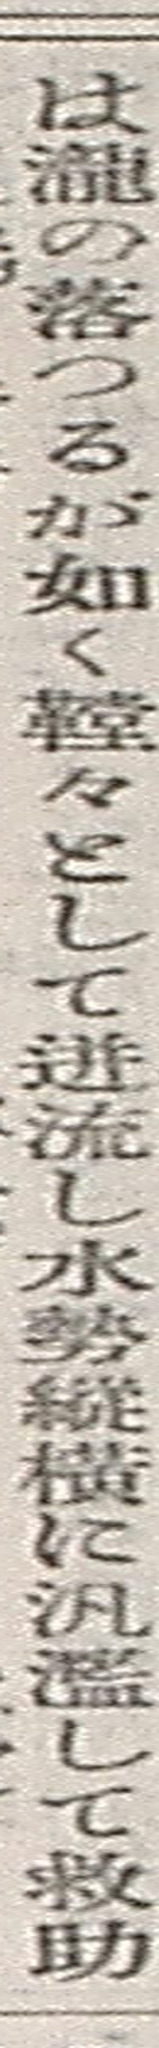は滝の落つるが如く鞺々として迸流し水勢縦横に氾濫して救助
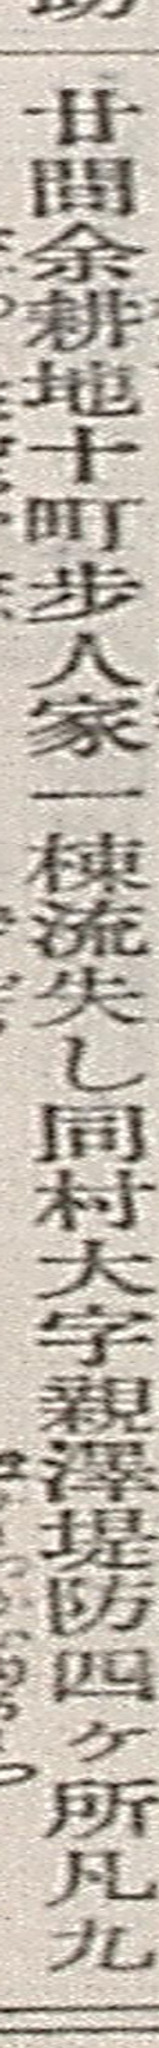廿間余耕地十町歩人家一棟流失し同村大字親沢堤防四ヶ所凡九
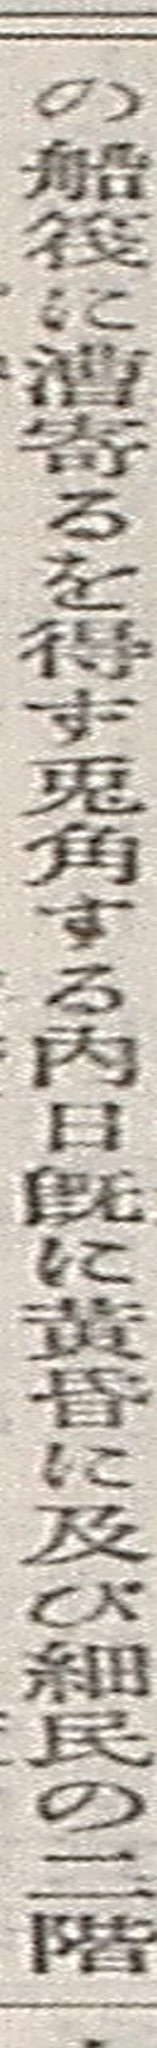の船筏に漕寄るを得ず兎角する内日既に黄昏に及び細民の二階
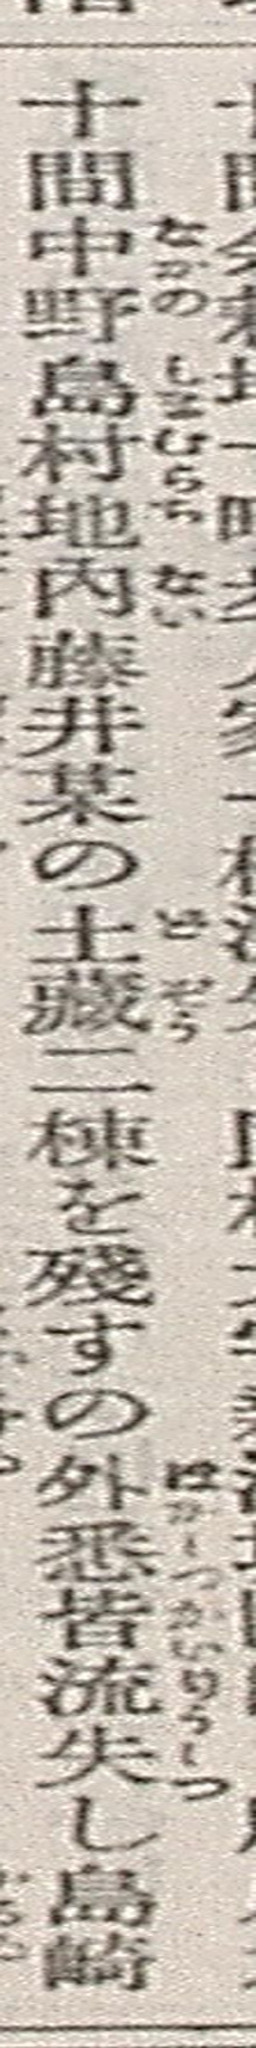十間中野島村地内藤井某の土蔵二棟を残すの外悉皆流失し島崎
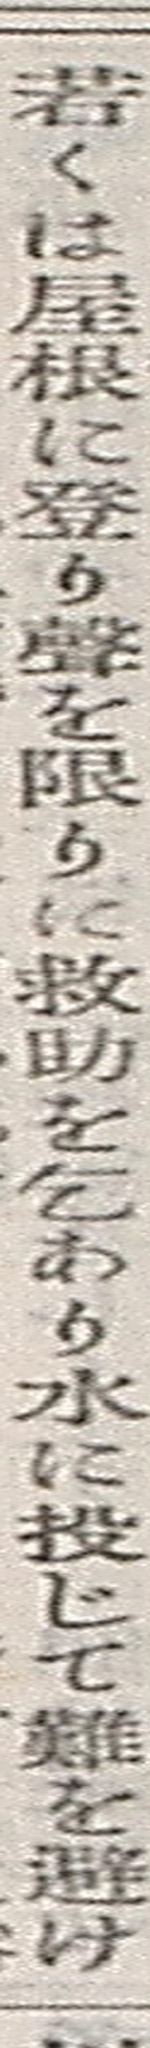若くは屋根に登り声を限りに救助を乞あり水に投じて難を避け
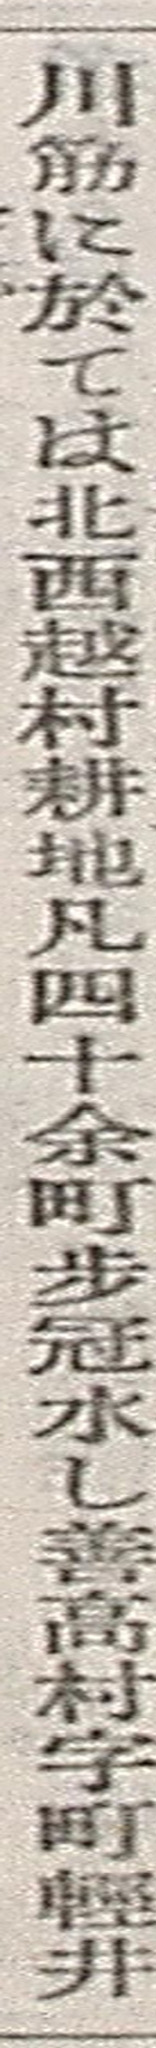川筋に於ては北西越村耕地凡四十余町歩冠水し善高村字町軽井
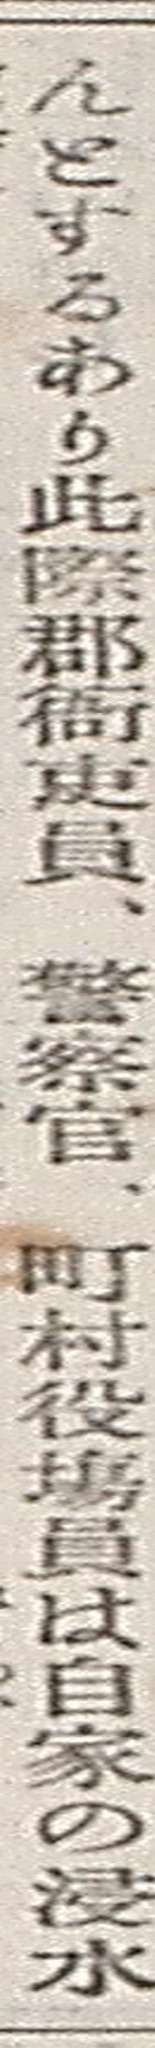んとするあり此際郡衙吏員、警察官、町村役場員は自家の浸水
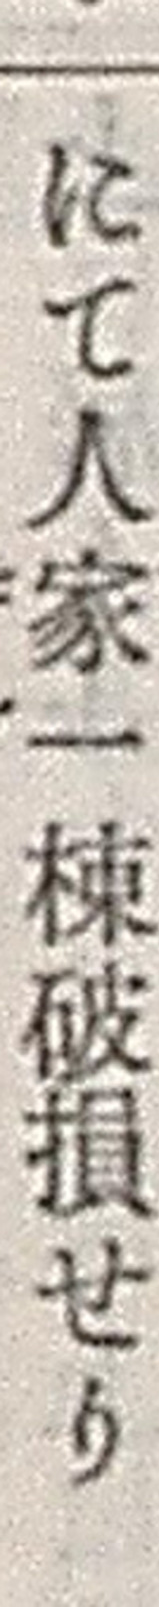にて人家一棟破損せり
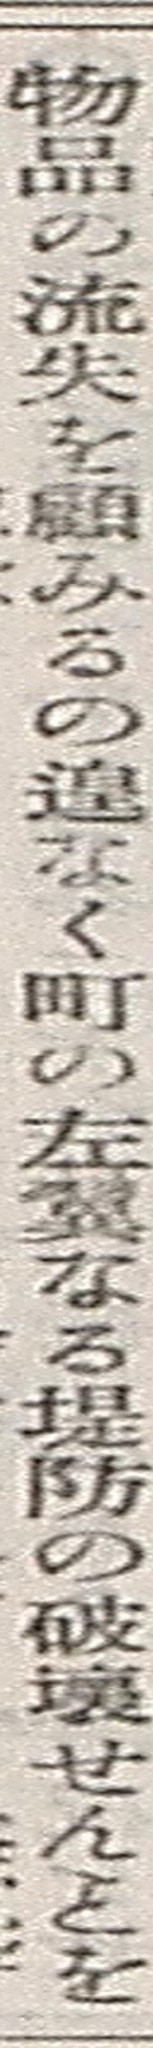物品の流失を顧みるの遑なく町の左翼なる堤防の破壊せんことを
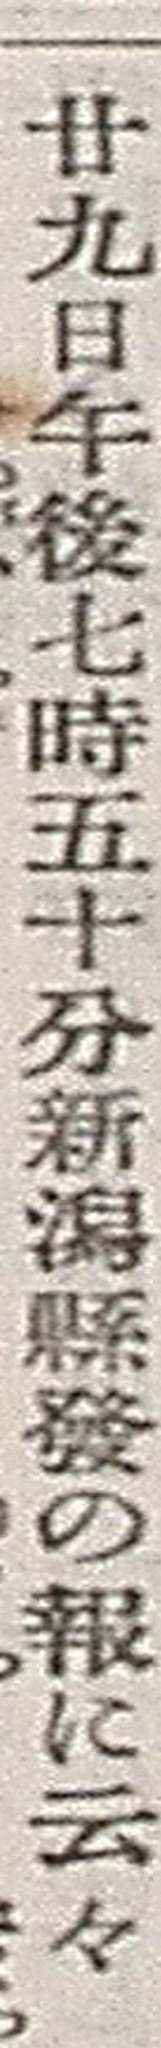廿九日午後七時五十分新潟県発の報に云々
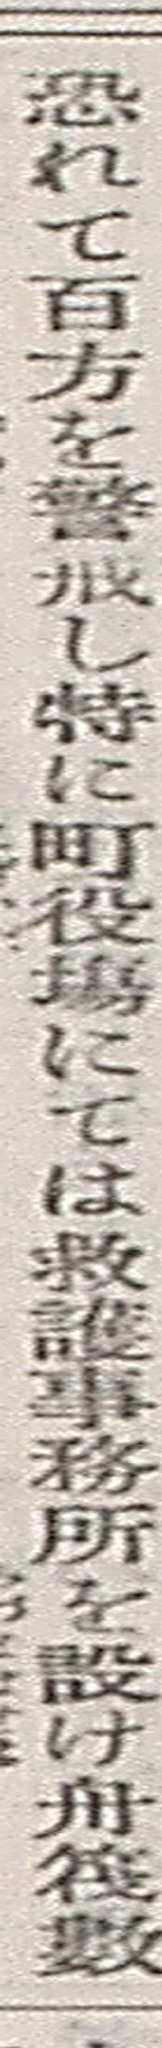恐れて百方を警戒し特に町役場にては救護事務所を設け舟筏数
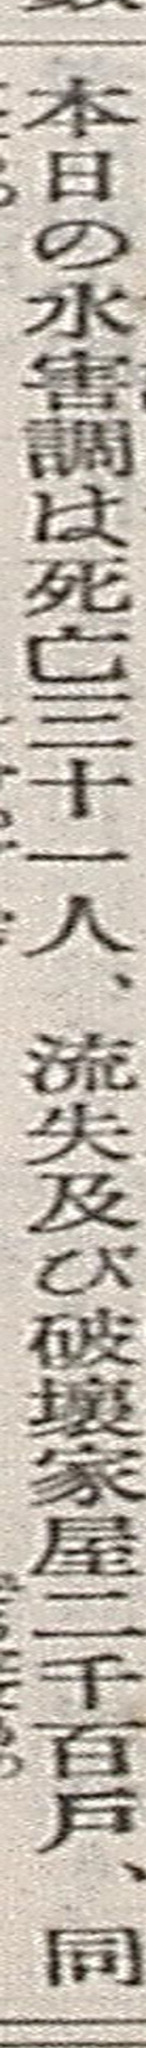本日の水害調は死亡三十一人、流失及び破壊家屋二千百戸、同
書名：風俗畫報臨時増刊第百二十八號　洪水被害録（下）
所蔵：東京大学地震研究所図書室 Earthquake Research Institute Library, The University of Tokyo, JAPAN
